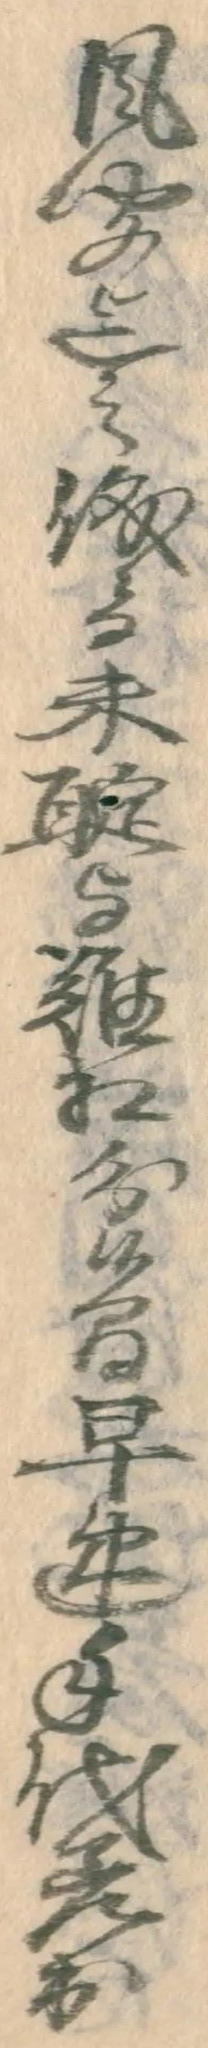風聞迄之儀ニ而聢と難相分候間早速手代差出
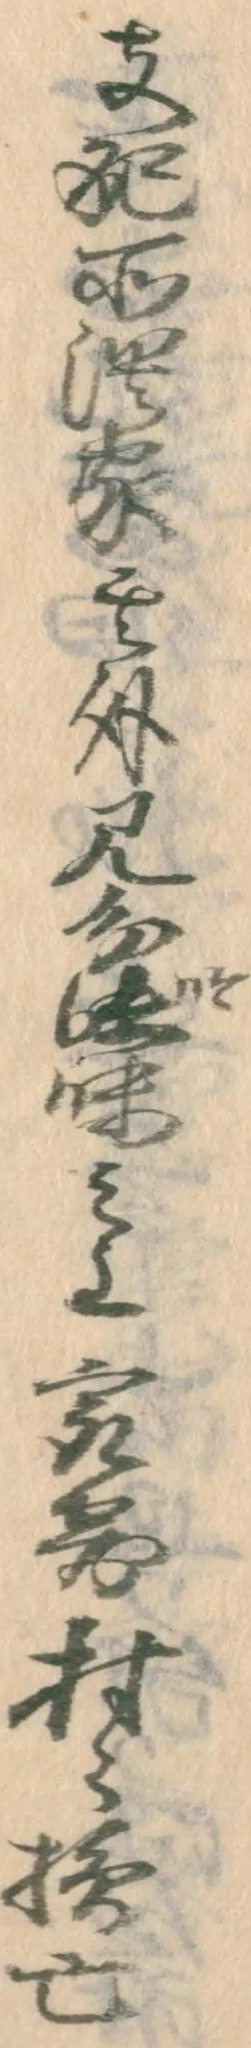支配所潰家其外見分吟味之上最寄村々損耗

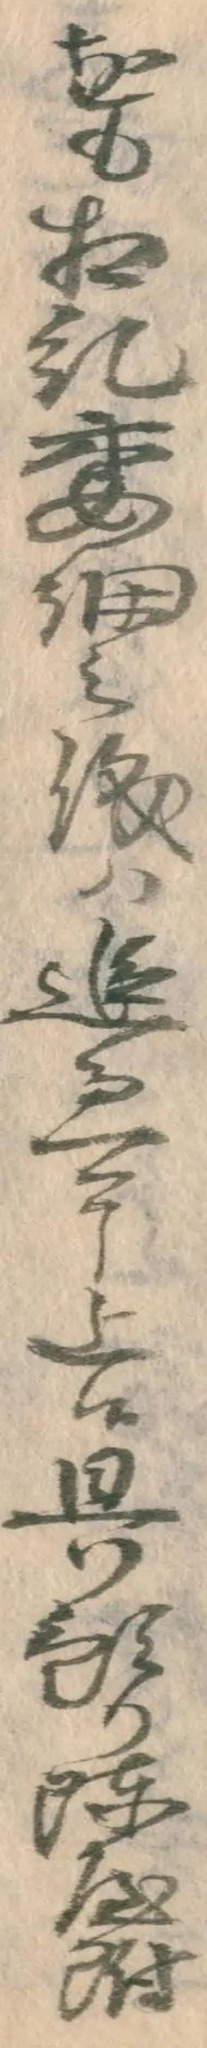をも相糺委細之儀は追而可申上候且御預り陣屋附
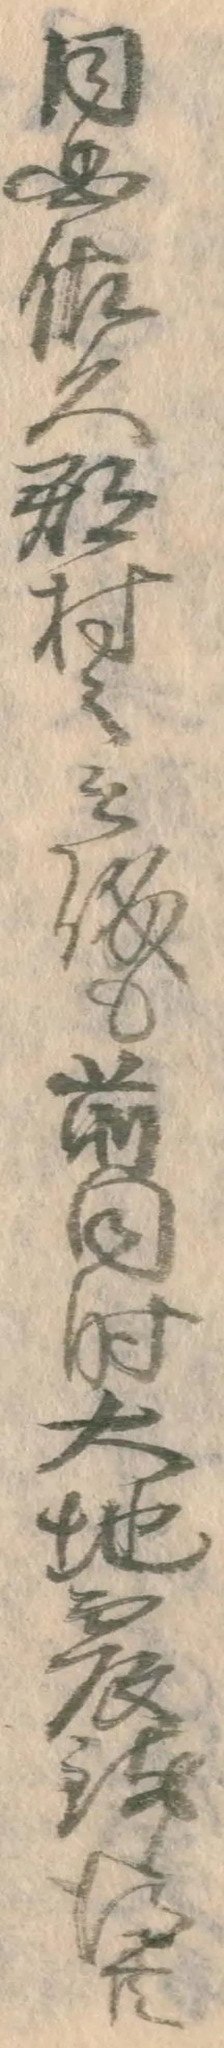同国佐久郡村々之儀も前同時大地震致候得共
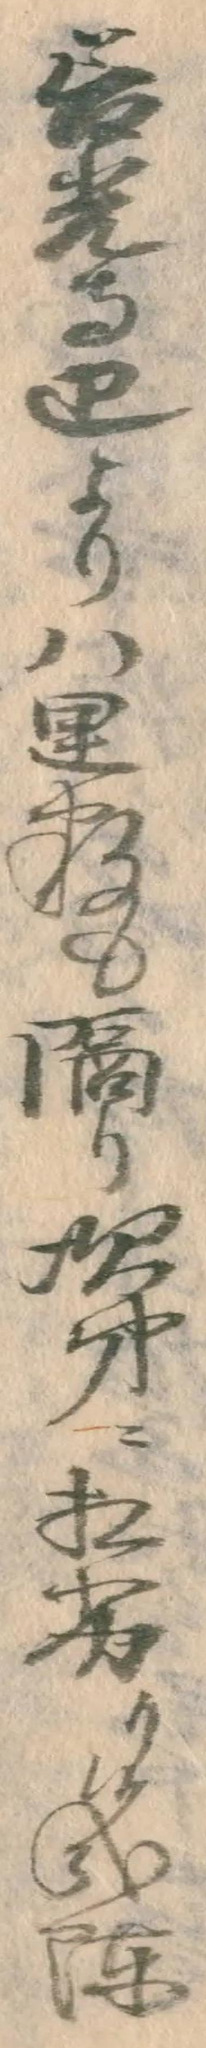善光寺辺よりハ里数も隔り候次第二相劣り候哉陣
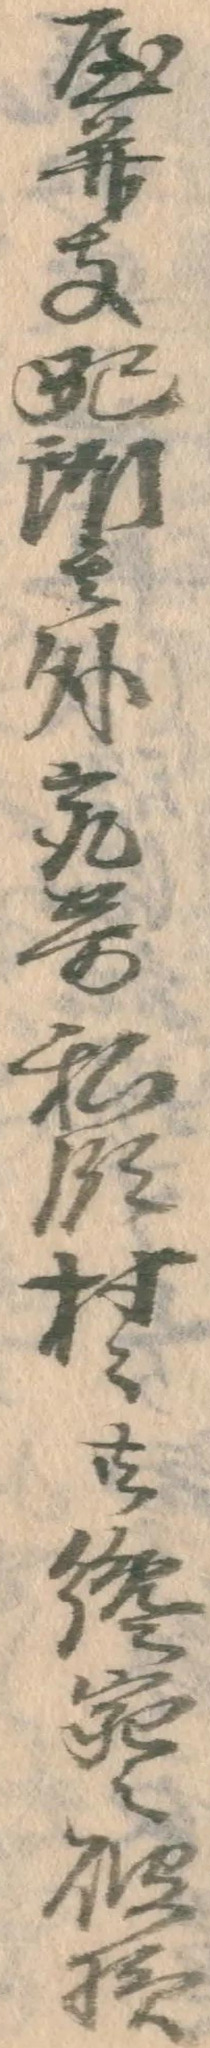屋并支配所其外最寄私領村々共纔宛之破損
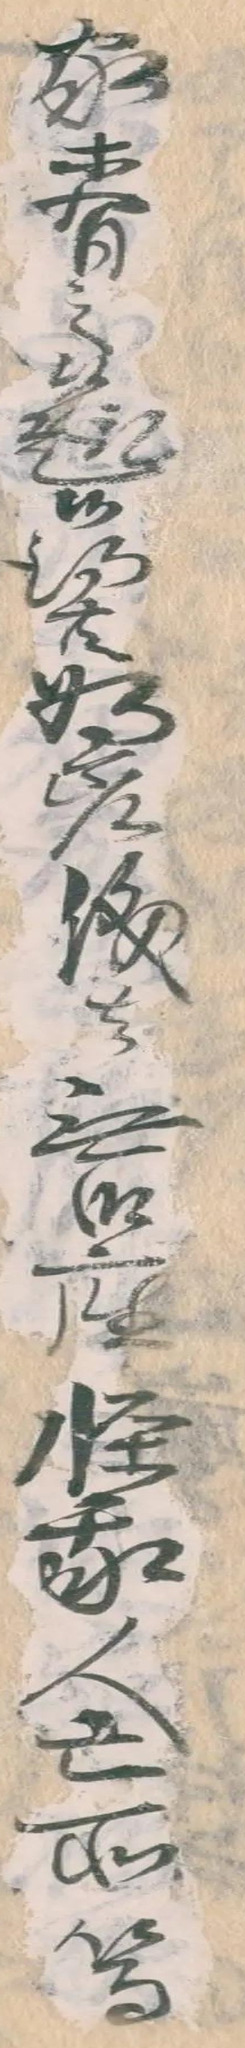家等有之候趣候得共為差儀者無御座怪我人亡所等
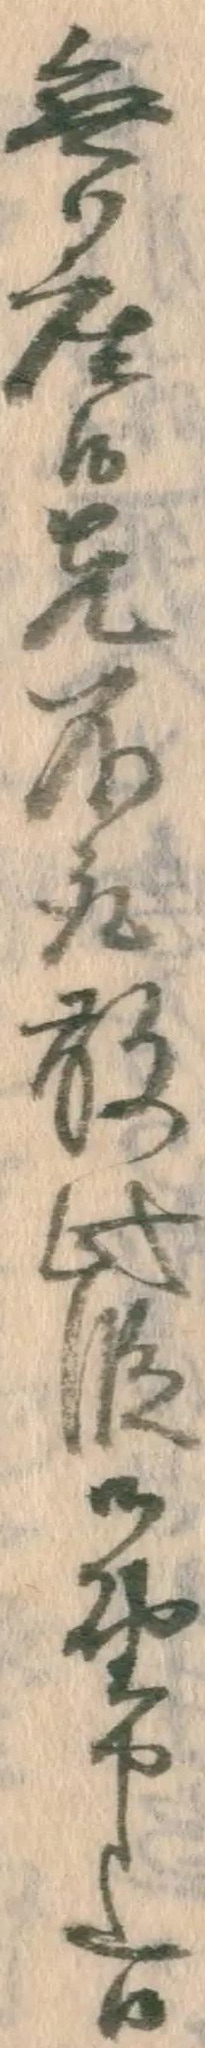無御座候先不取敢此段御届申上候
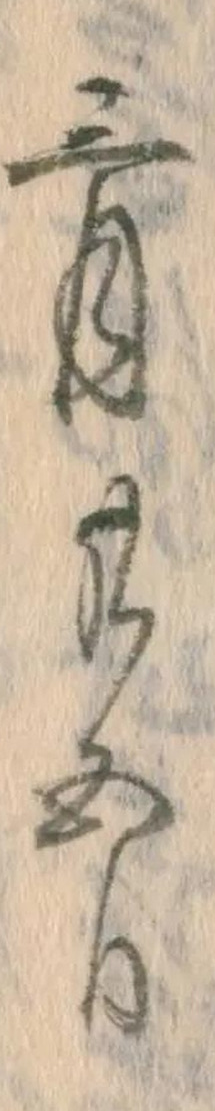三月廿五日
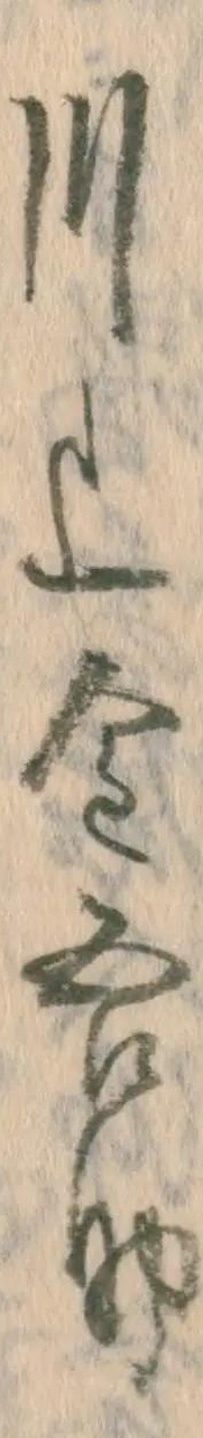川上金吾助
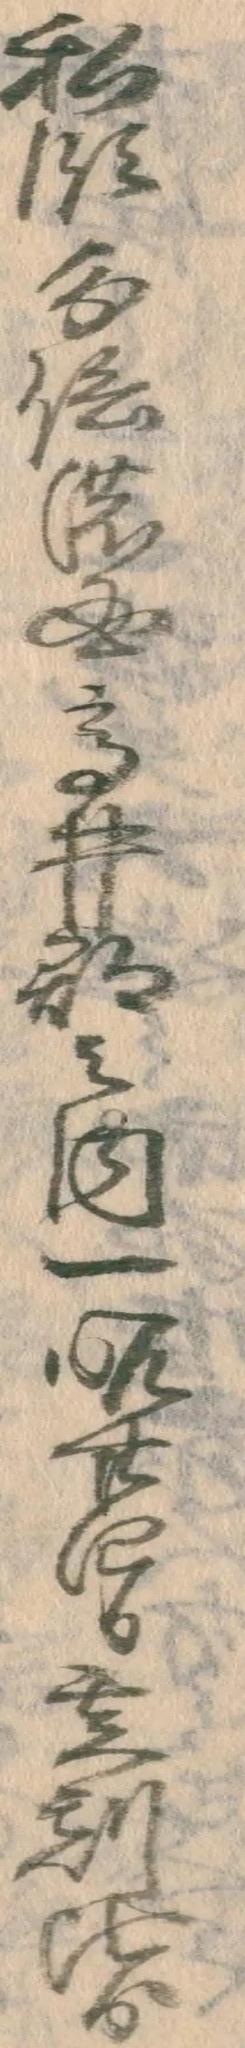私領分信濃国高井郡之内一昨廿四日亥刻比ゟ
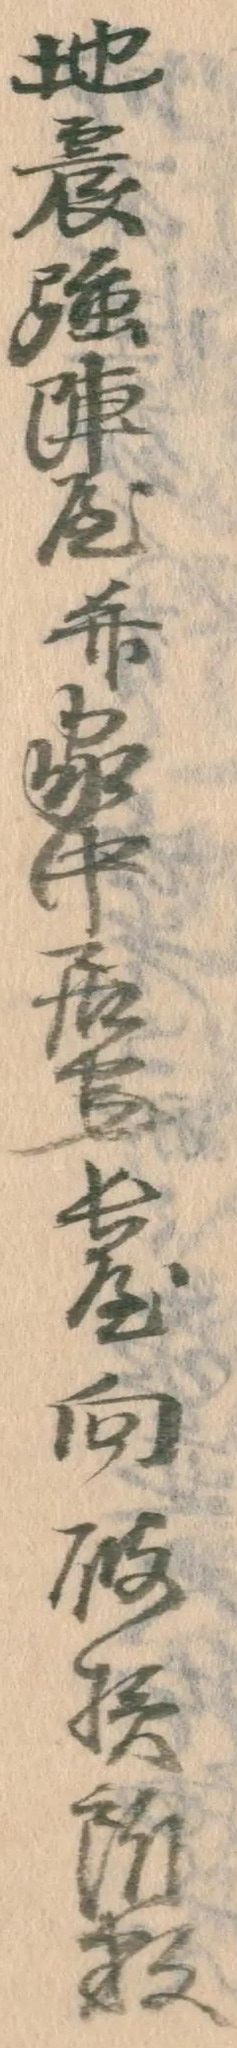地震強陣屋并家中居宅長屋向破損所数
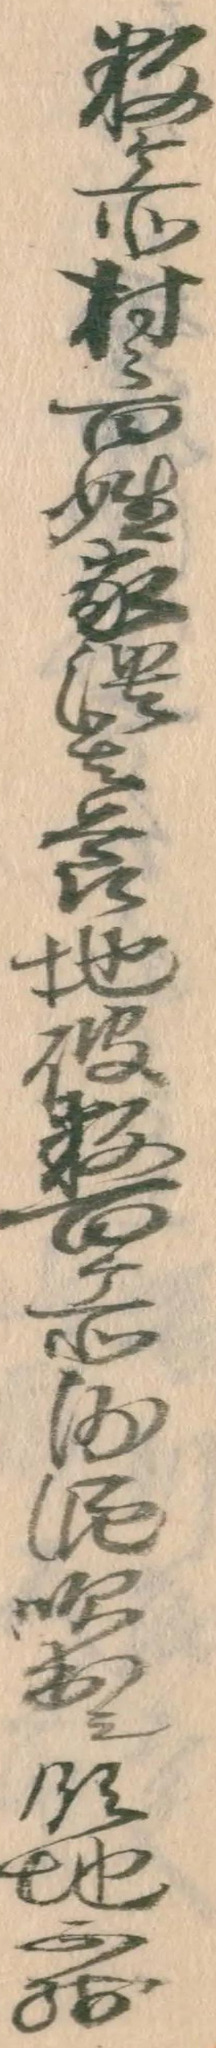数ヶ所村々百性家潰其節地破数百ケ所砂泥吹出シ耕地不残
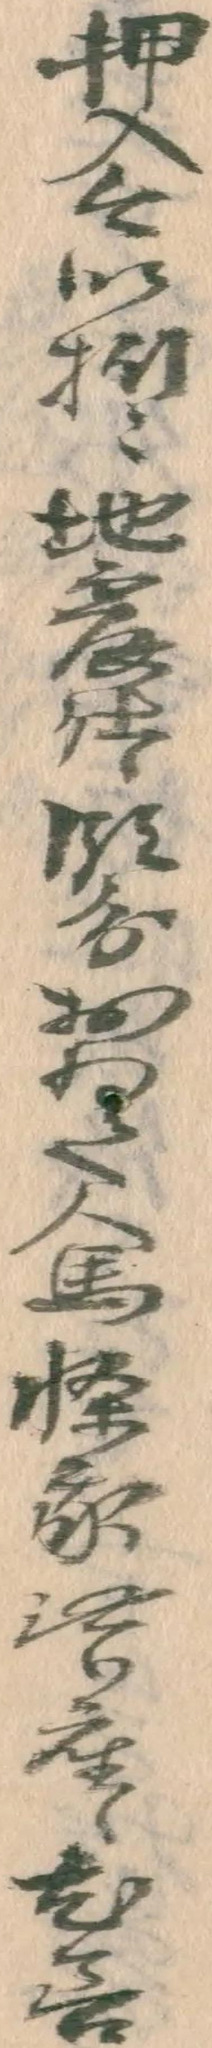押入今以折々地震仕候領分おゐて人馬怪我無御座候尤善
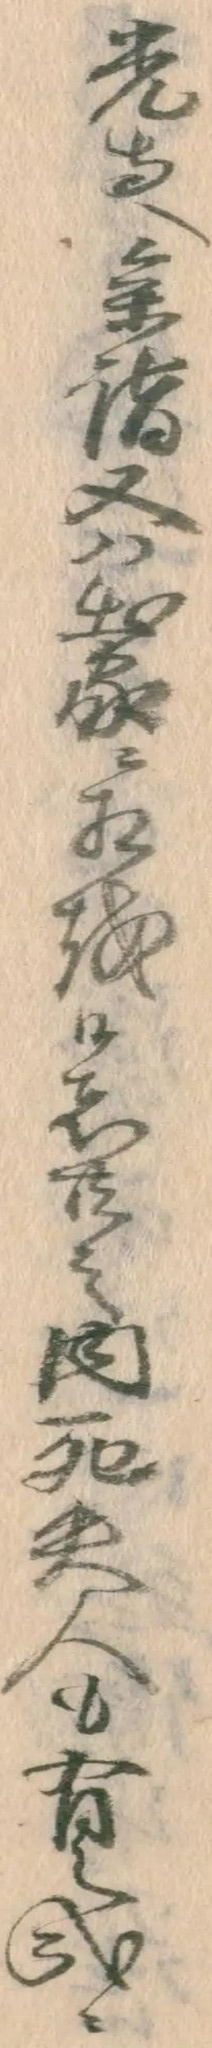光寺へ参詣又ハ出稼二相越候者共之内死失人も有之哉ニ
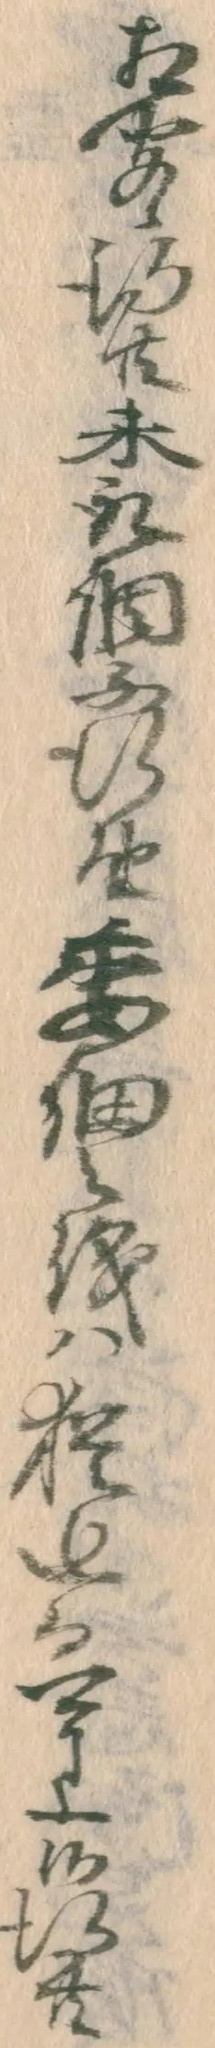相聞候得共未取調不行届候委細之儀ハ猶追而可申上候得共
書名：信州大地震之記
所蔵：国立国会図書館 National Diet Library, JAPAN
